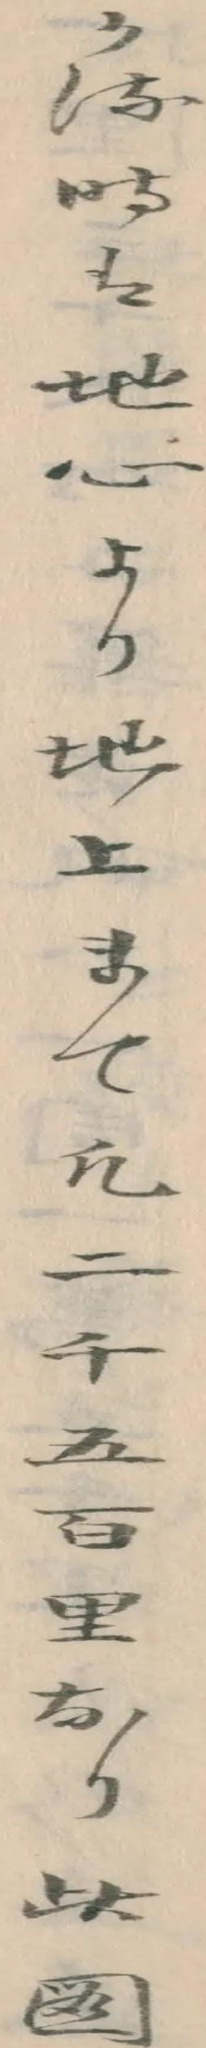かる時は地心より地上まて凡二千五百里なり此図
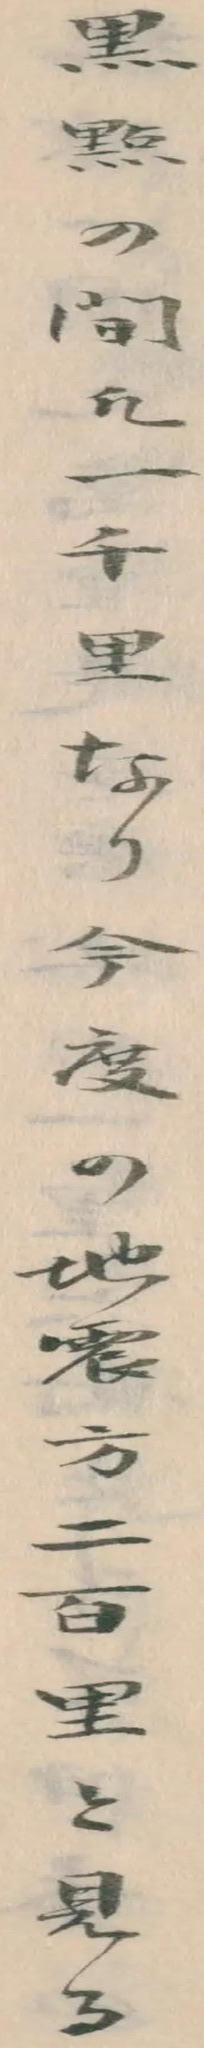黒点の間凡一千里なり今度の地震方二百里と見る
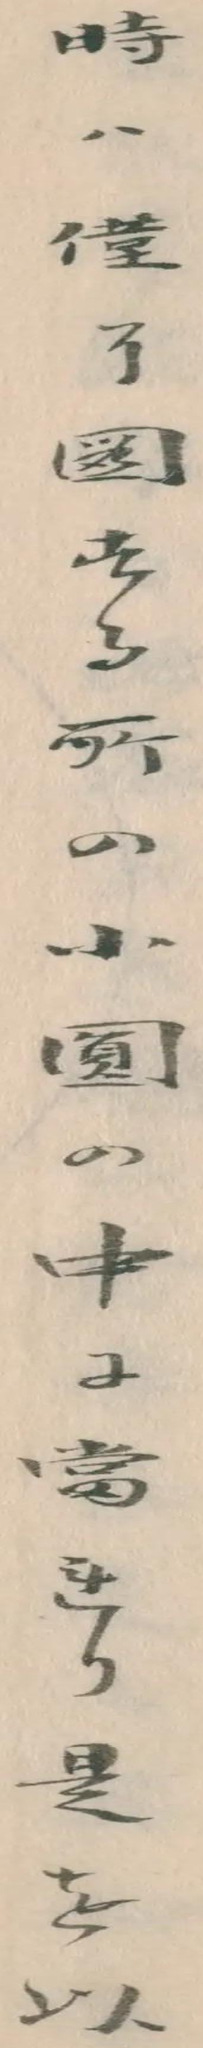時は僅に図する所の小円の中に当れり是を以
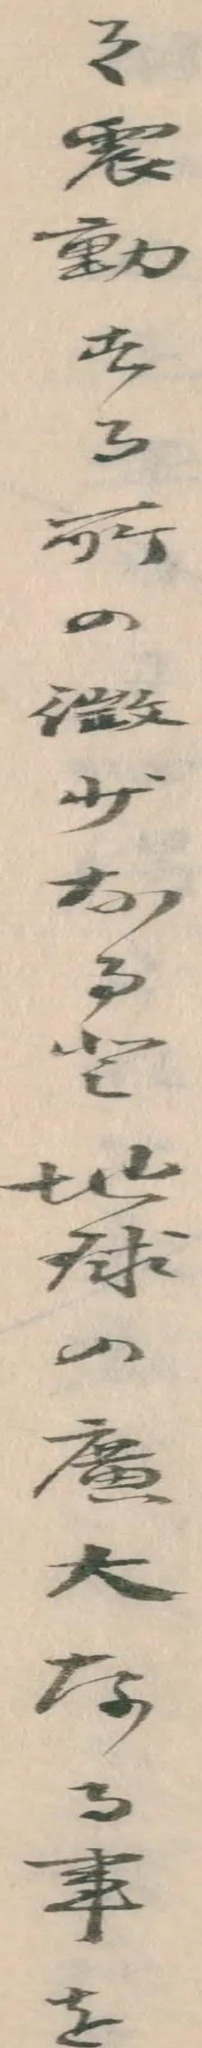て震動する所の徴少なると地球の広大なる事を
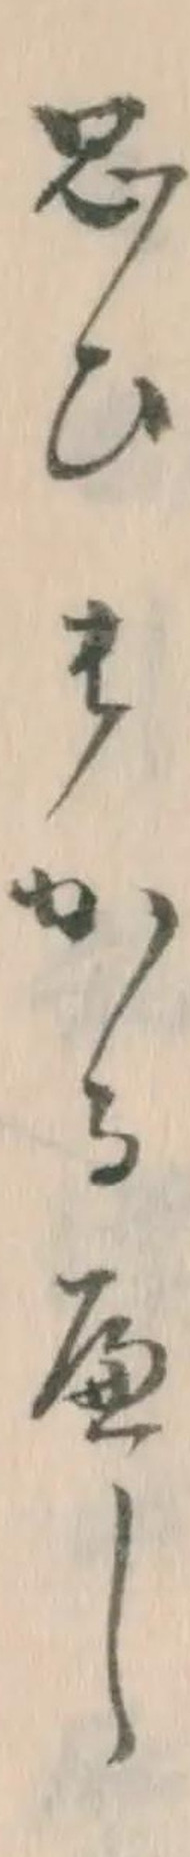思ひはかるへし
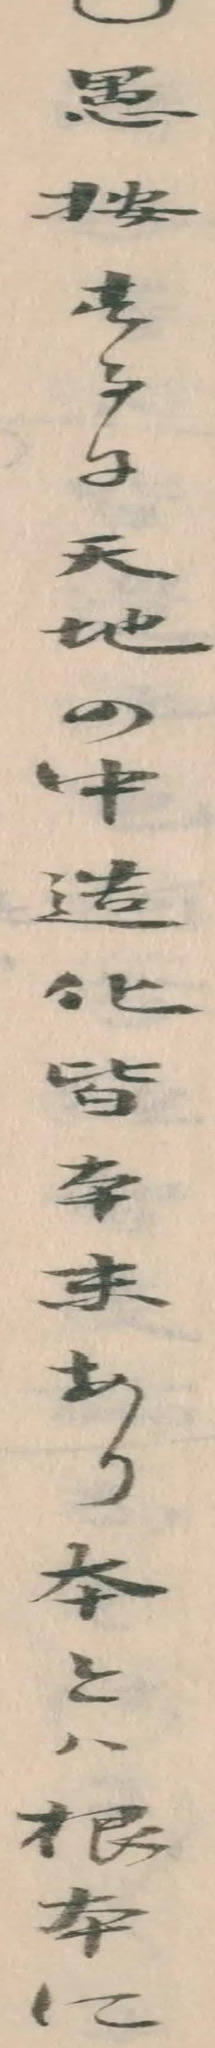○愚按するに天地の中造化皆本末あり本とは根本に
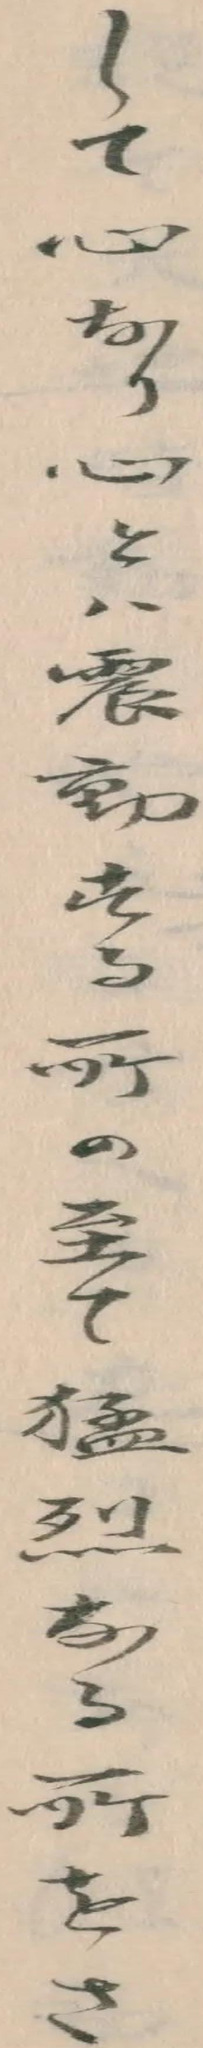して心なり心とは震動する所の至て猛-烈なる所をさ
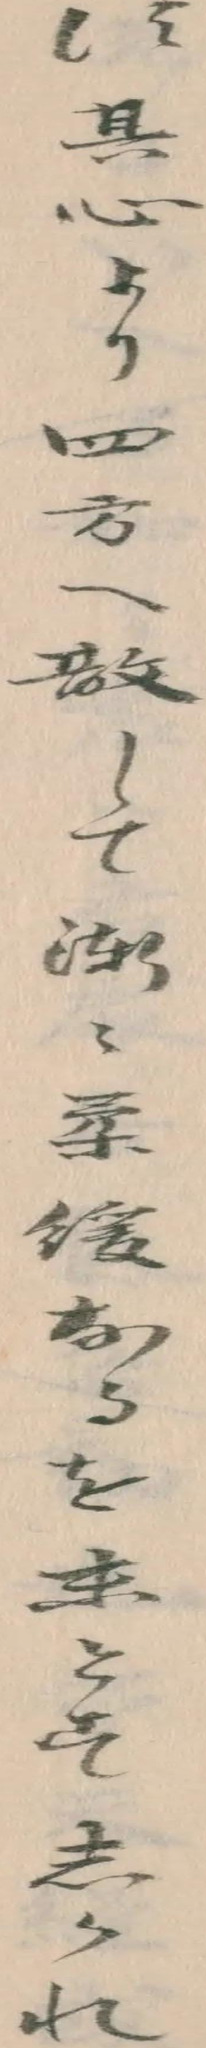す其心より四方へ散して漸々柔緩なるを末とすしかれ
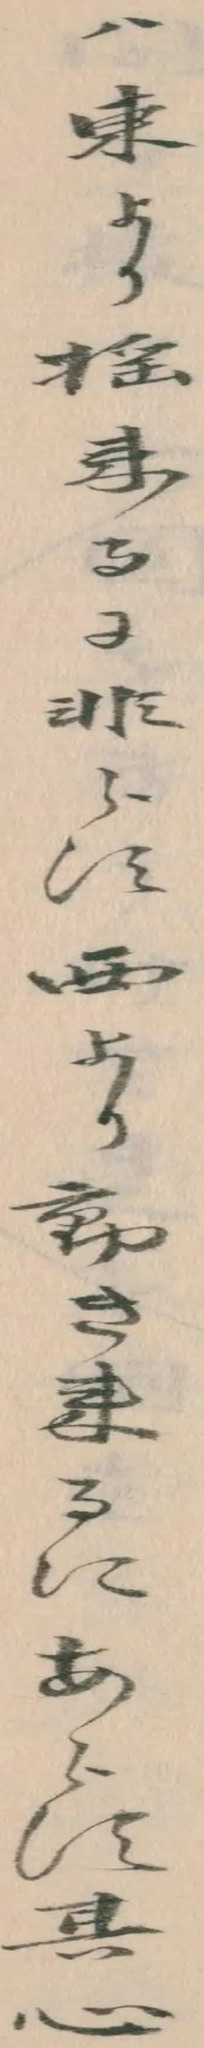は東より揺来るに非らす西より動き来るにあらす其心
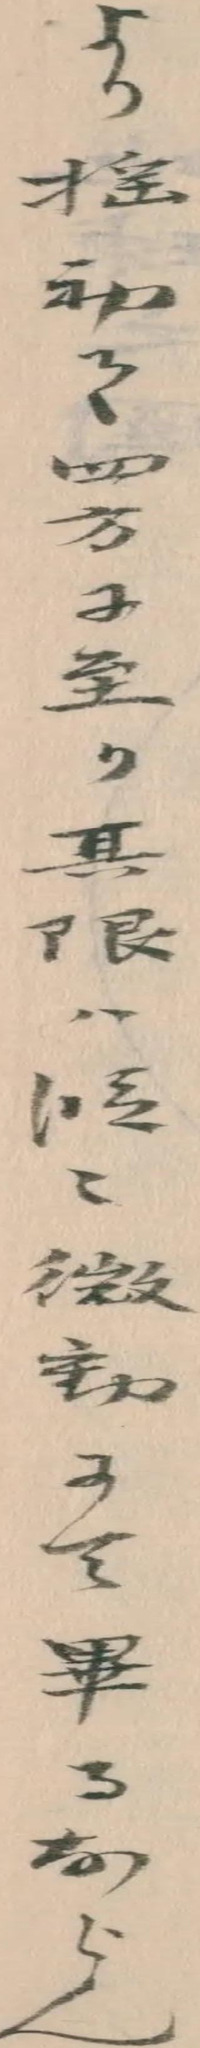より揺初て四方に至り其限は段々微動にて畢るならん
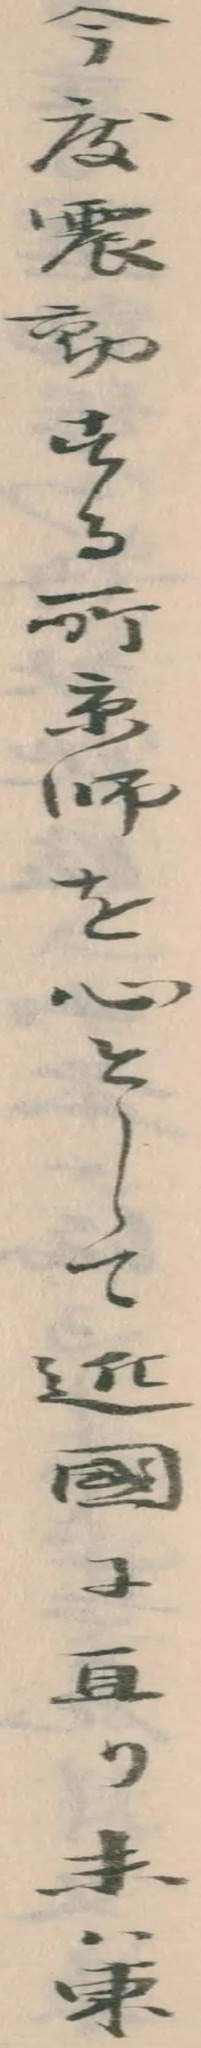今度震動する所京師を心として近国に亘り末は東
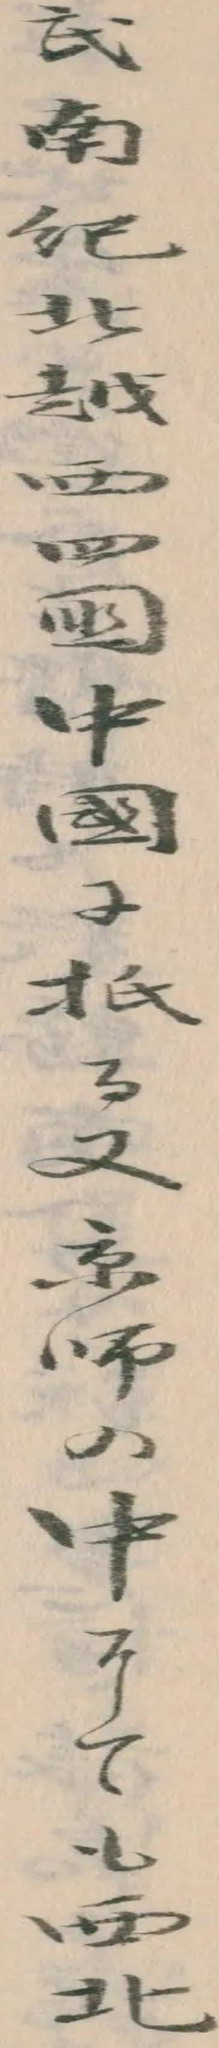武南紀北越西四国中国に抵る又京師の中にても西北
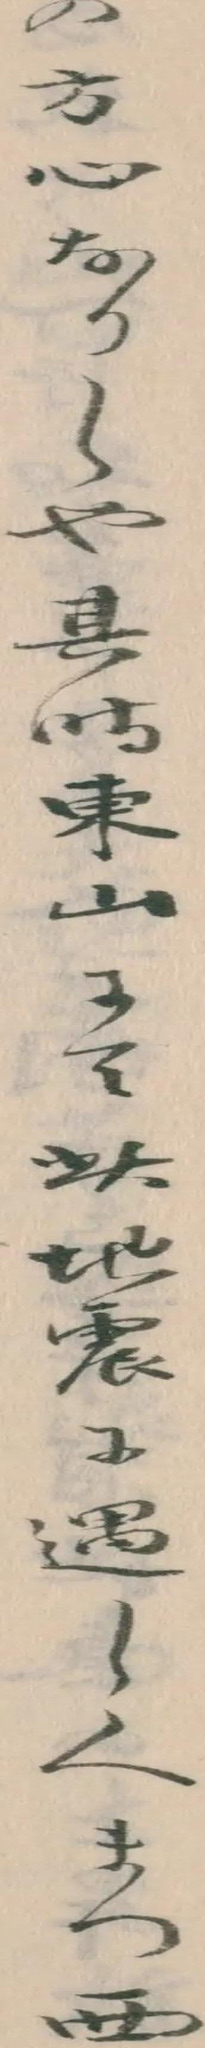の方心なりしや其時東山にて此地震に遇し人まつ西
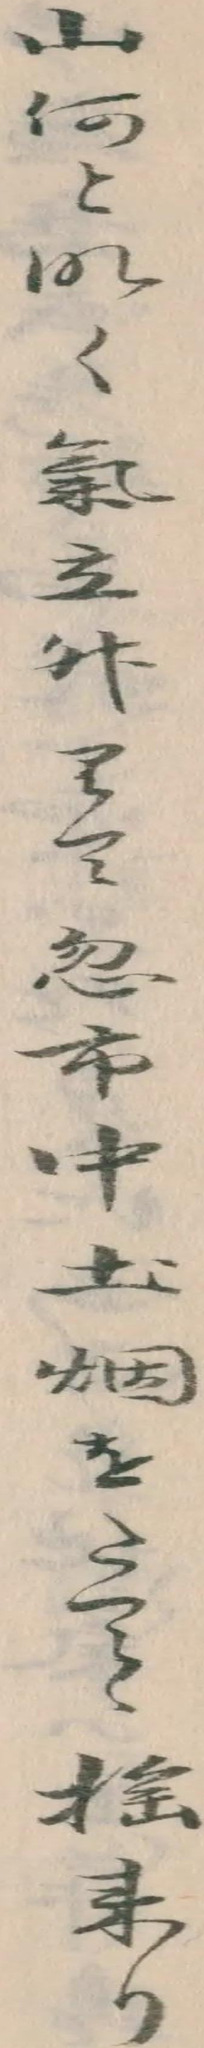山何となく気立升りて忽市中土煙をたてゝ揺来り
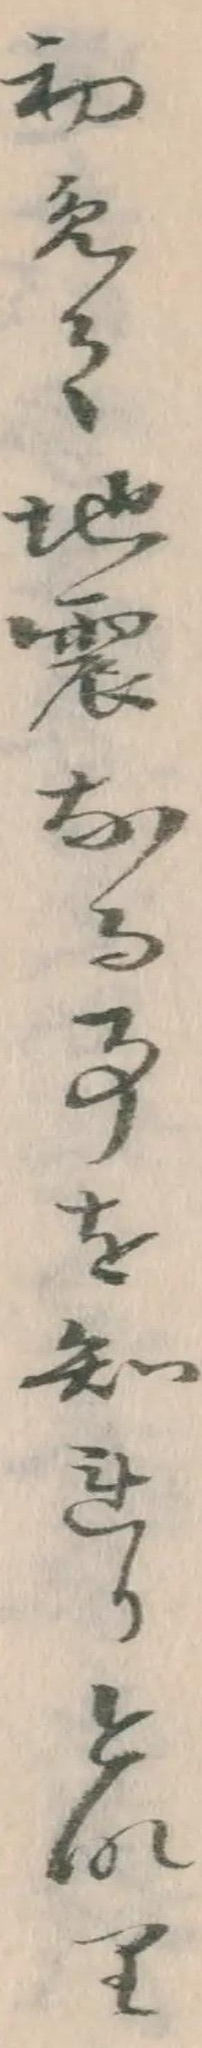初めて地震なる事を知れりとなり
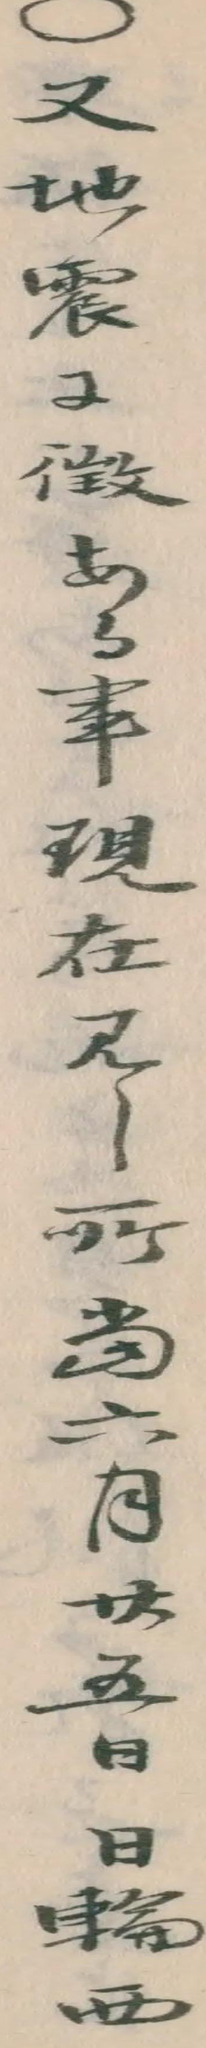○又地震に徴ある事現在見し所当六月廿五日日輪西
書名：地災撮要. 巻11-12(地震之部)
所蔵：国立国会図書館 National Diet Library, JAPAN
